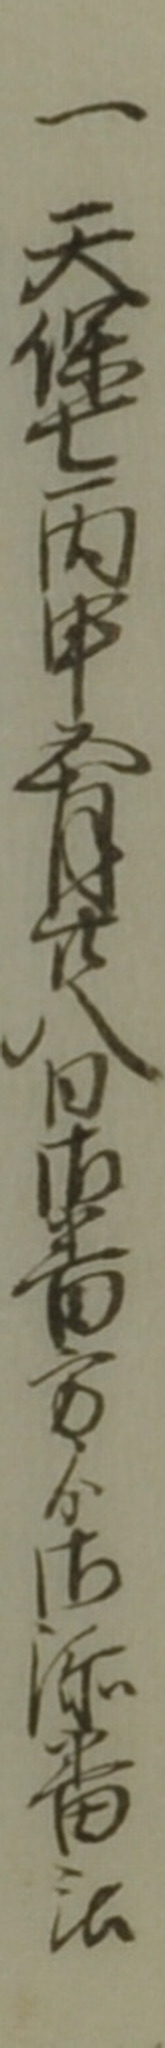一天保七丙申五月廿八日御番方より御添番被
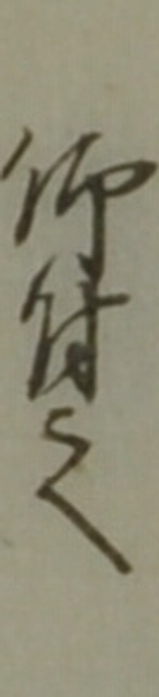仰付之
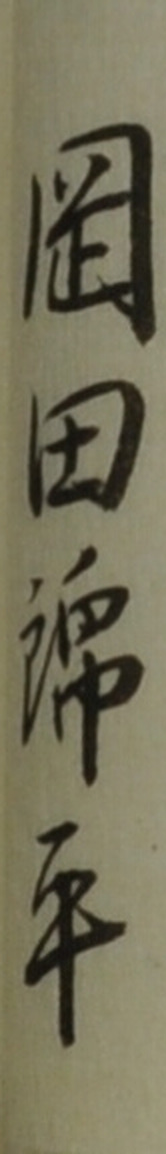岡田錦平
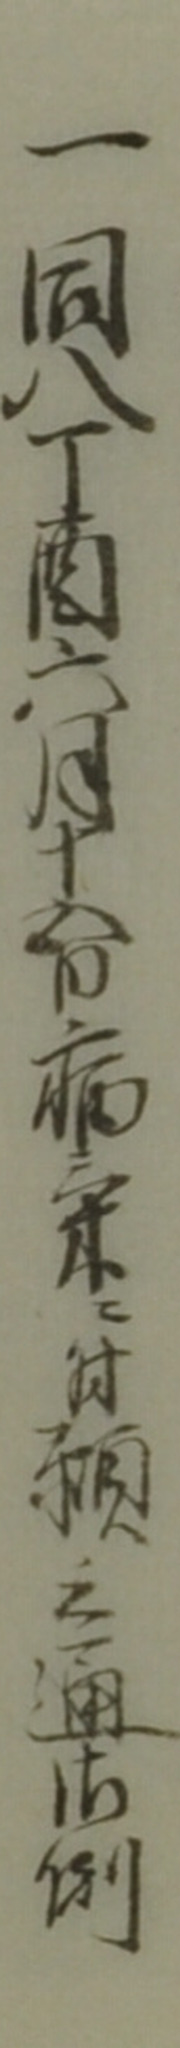一同八丁酉六月十五日病気に付願之通御側
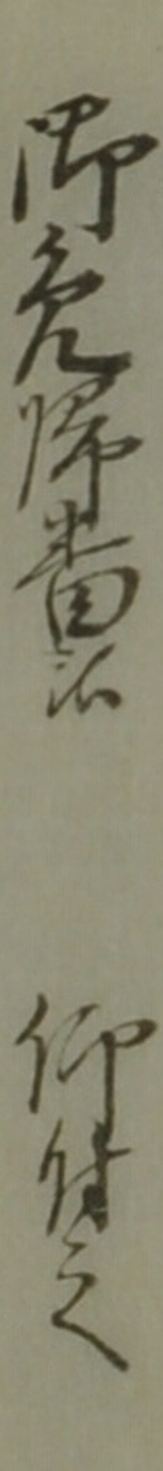御免帰番被仰付之
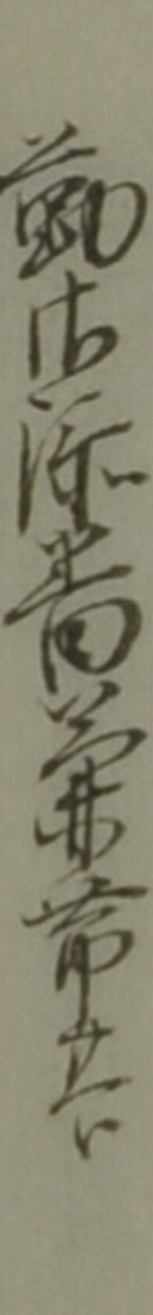勤御添番兼帯共
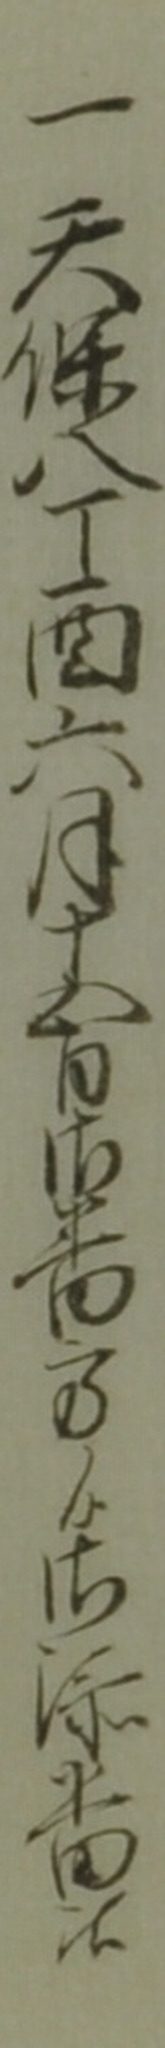一天保八丁酉六月十五日御番方より御添番被
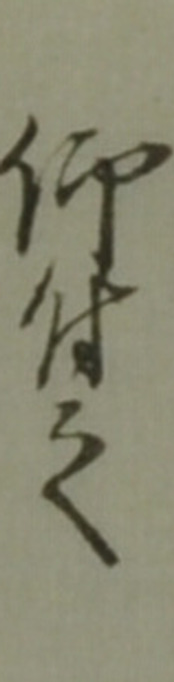仰付之
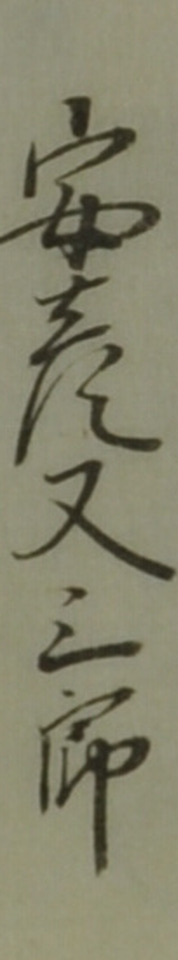安彦又三郎
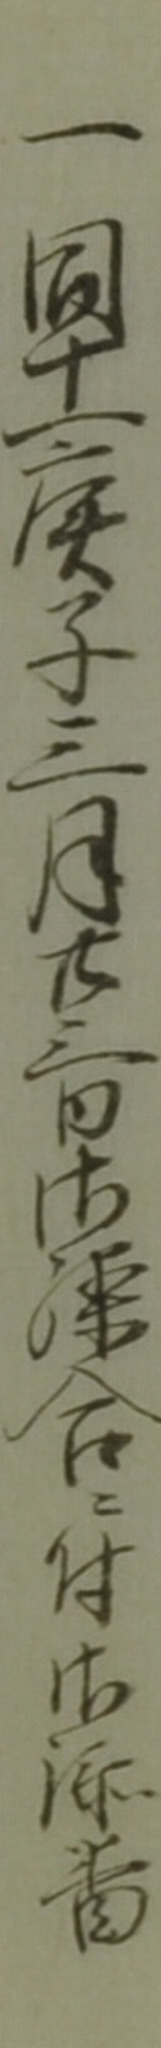一同十一庚子三月廿三日御繰合に付御添番
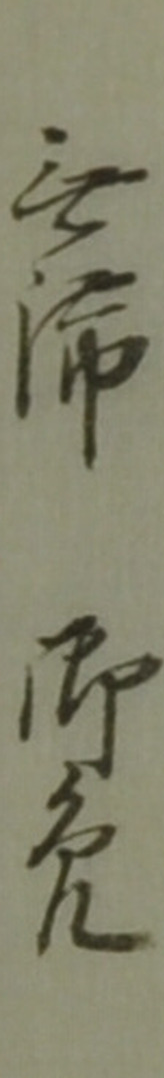無滞御免

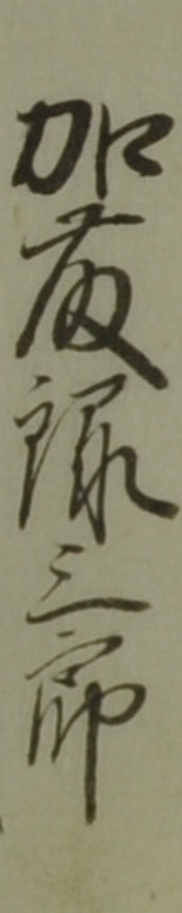加藤録三郎
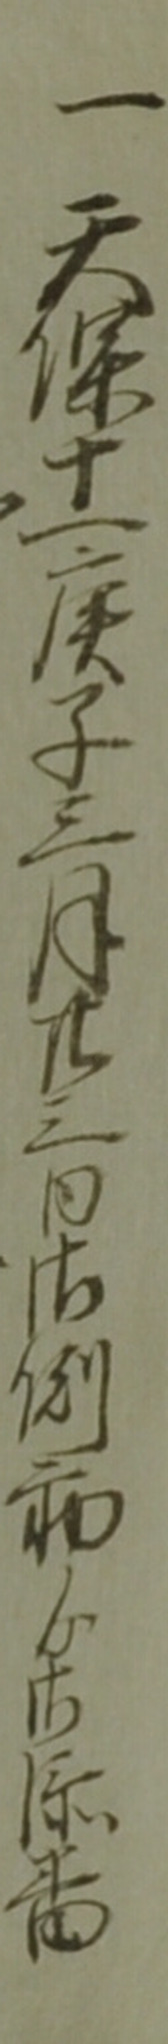一天保十一月庚子三月廿三日御側勤より御添番
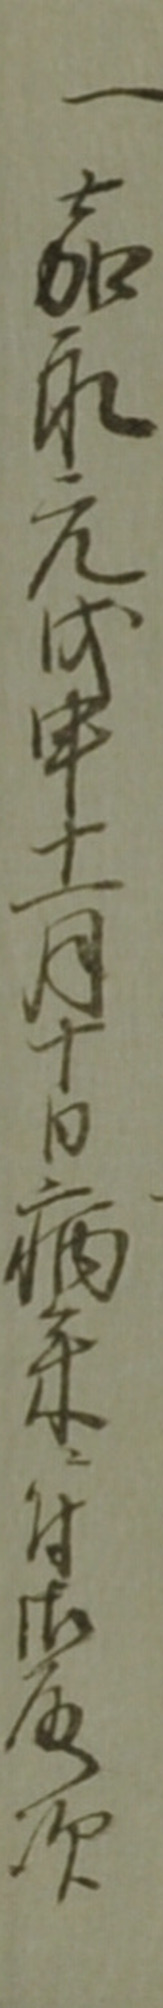一嘉永元戊申十一月十日病気に付御取次
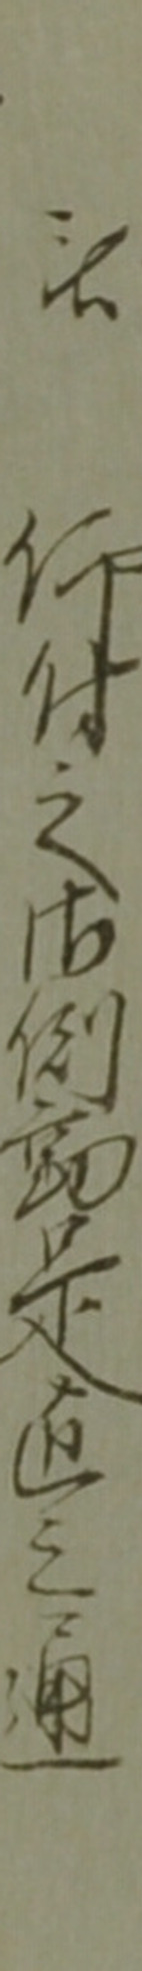被仰付之御側勤是迄之通
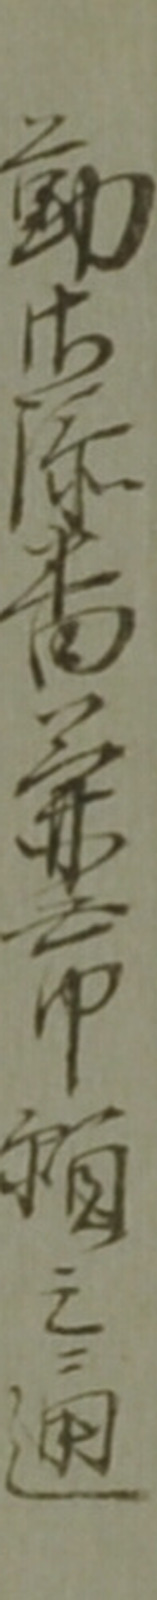勤御添番兼帯願之通
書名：諸御役代々録（八）
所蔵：伊那市立高遠町図書館・合同会社AMANE
